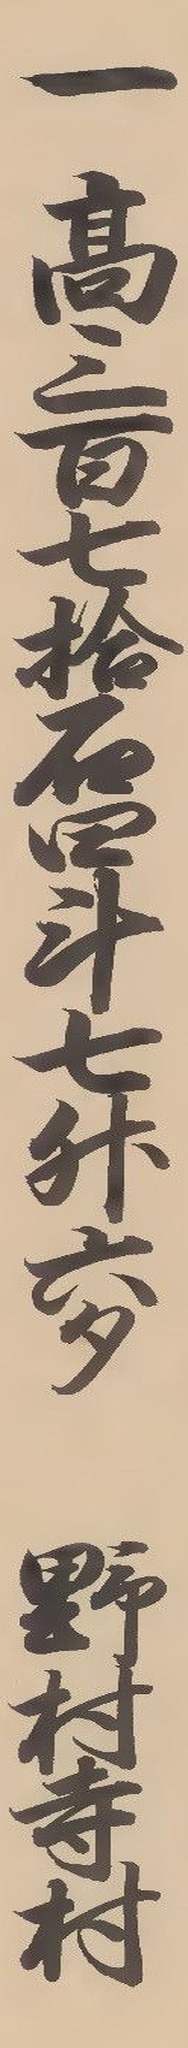一高三百七拾石四斗七升六勺野村寺村
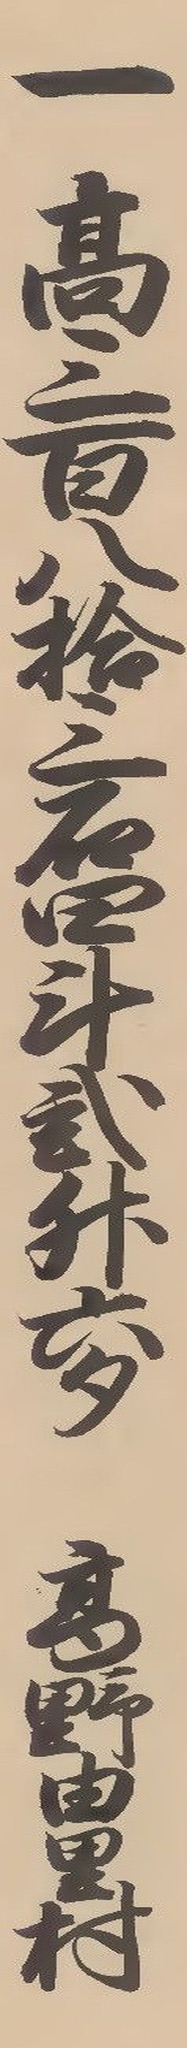一高三百八拾三石四斗弐升六勺高野由里村
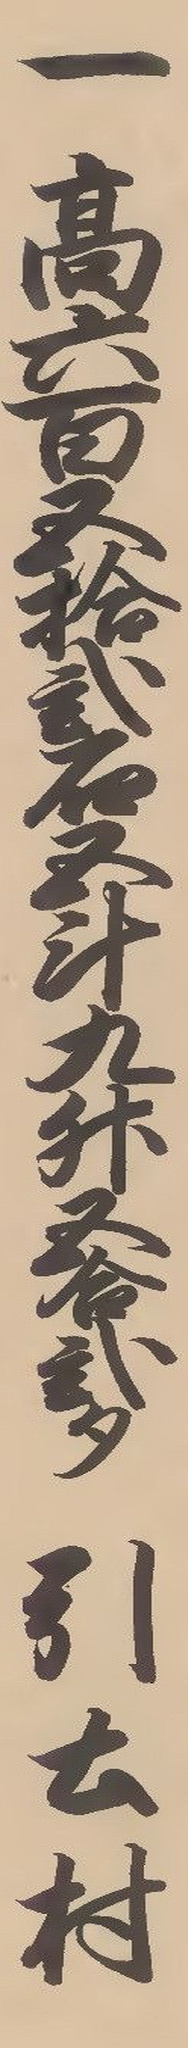一高六百五拾弐石五斗九升五合弐勺引土村
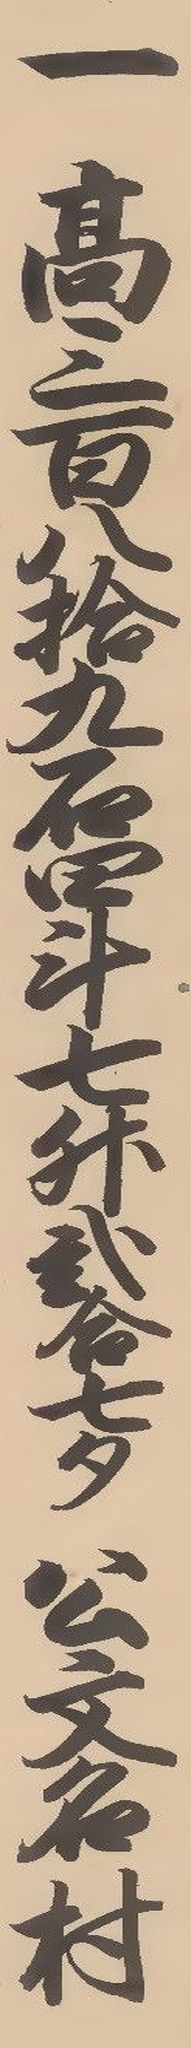一高三百八拾九石四斗七升弐合七勺公文名村
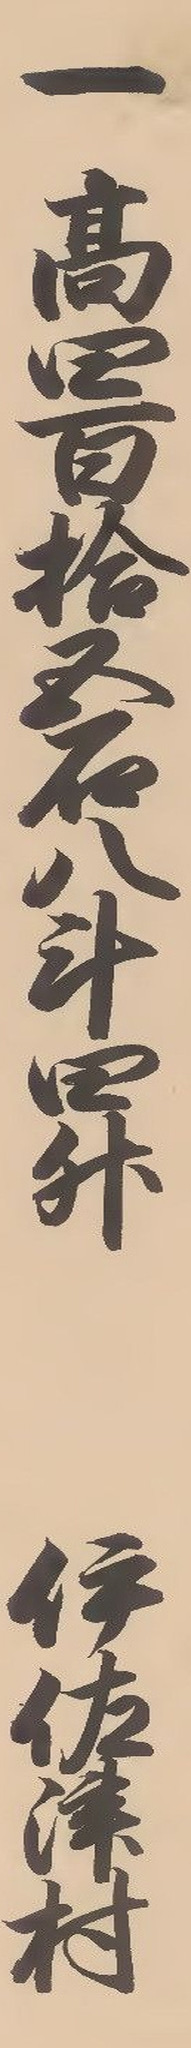一高四百拾五石八斗四升伊佐津村
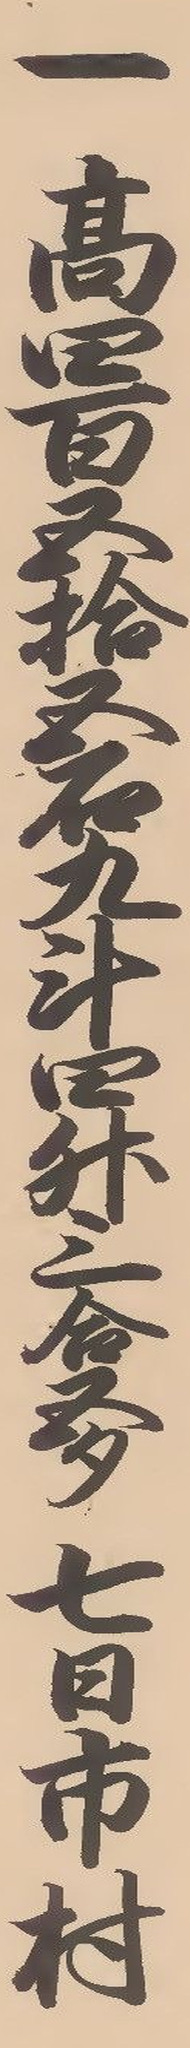一高四百五拾五石九斗四升三合五勺七日市村
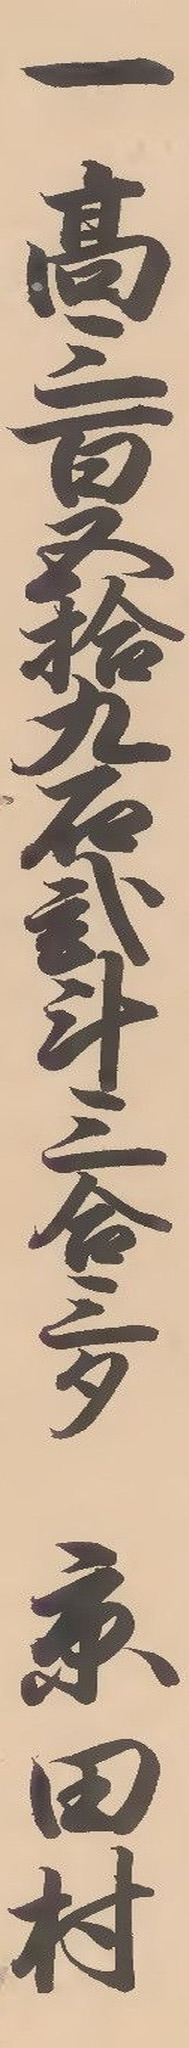一高三百五拾九石弐斗三合三勺京田村

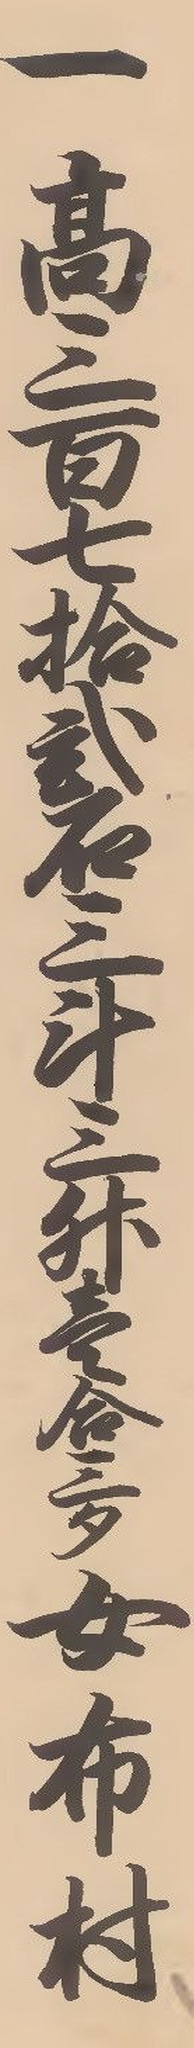一高三百七拾弐石三斗三升壱合三勺女布村
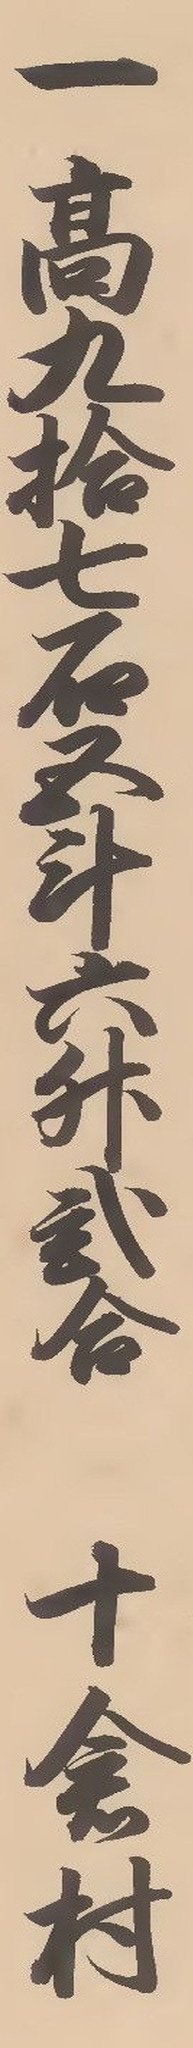一高九拾七石五斗六升弐合十倉村
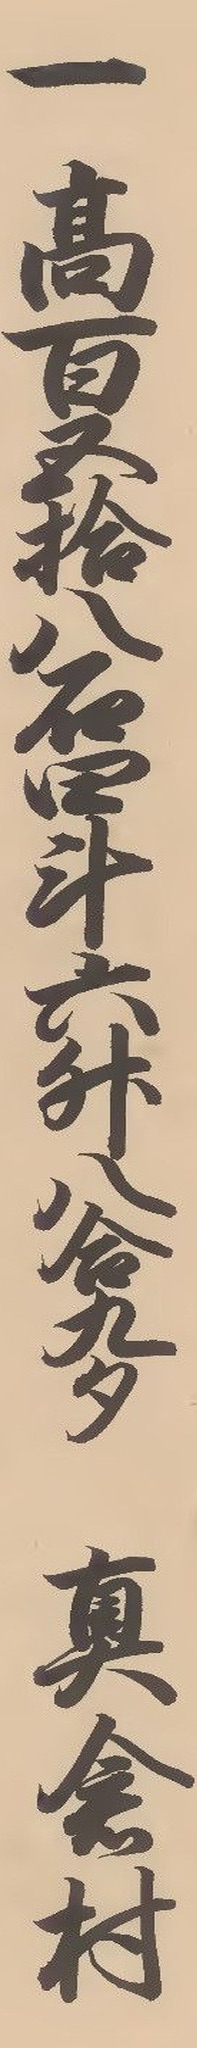一高百五拾八石四斗六升八合九勺真倉村
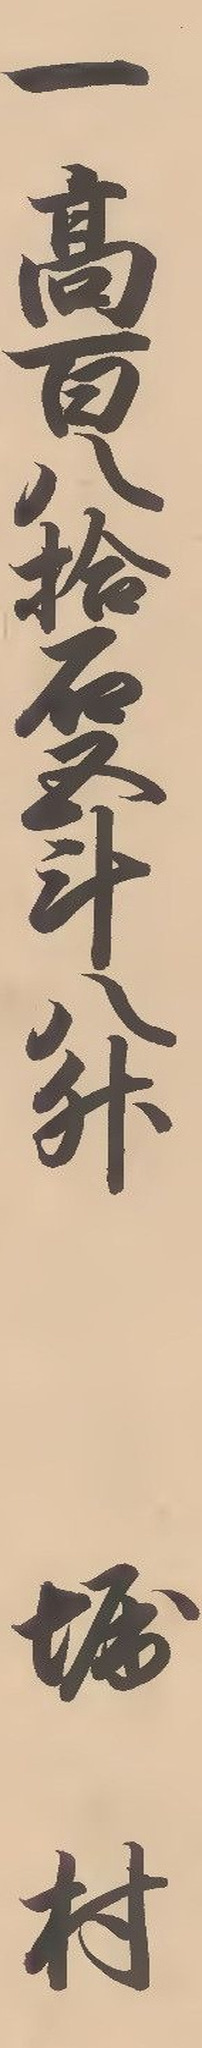一高百八拾石五斗八升堀村
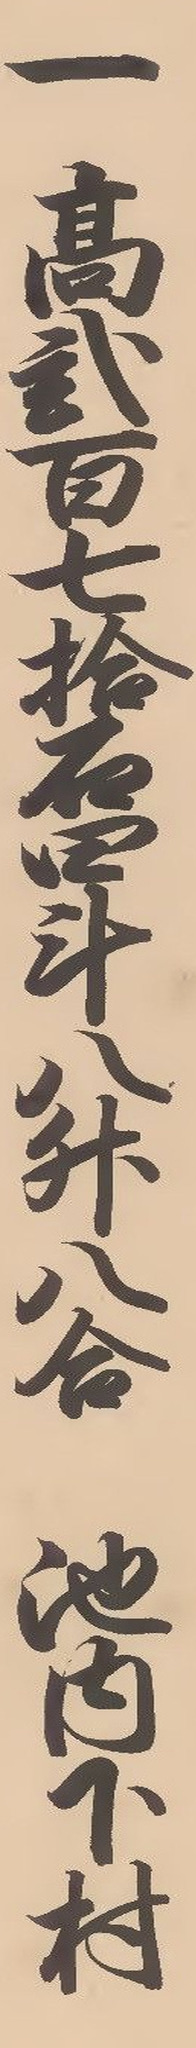一高弐百七拾石四斗八升八合池内下村
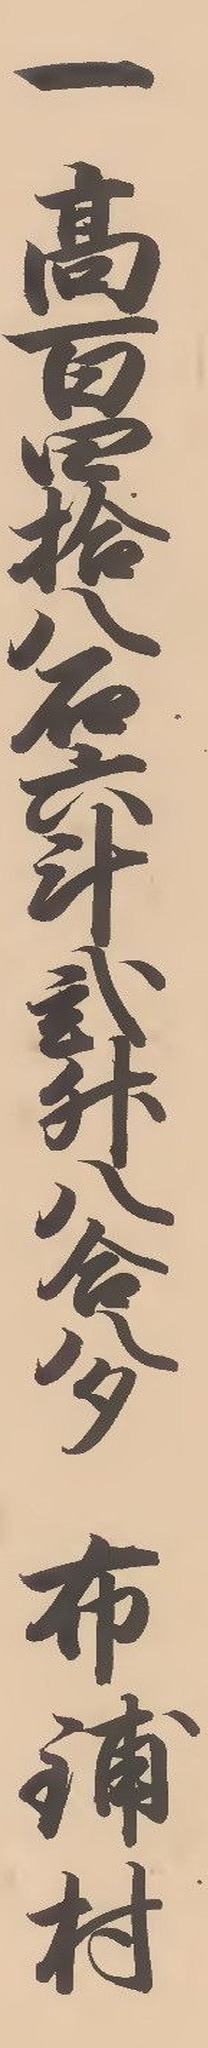一高百四拾八石六斗弐升八合八勺布鋪村
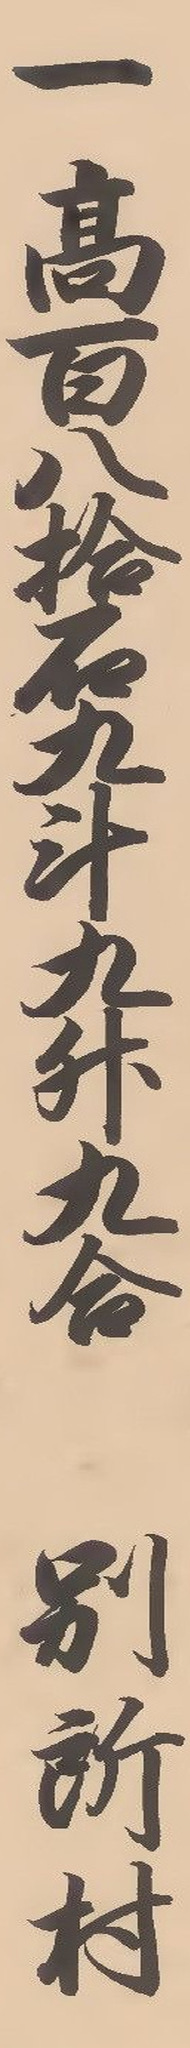一高百八拾石九斗九升九合別所村
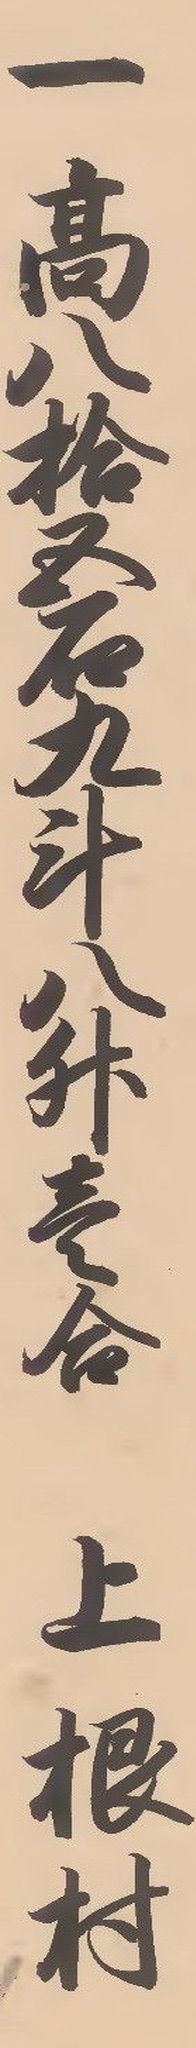一高八拾五石九斗八升壱合上根村

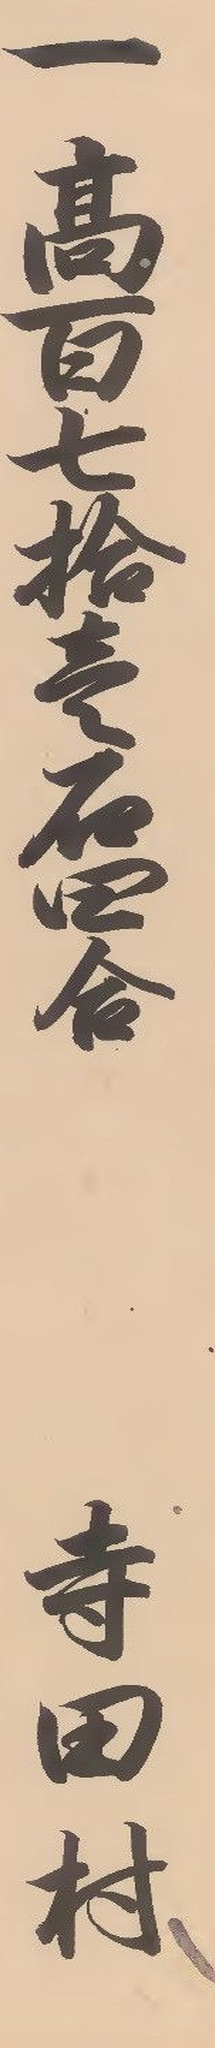一高百七拾壱石四合寺田村
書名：丹後国郷帳
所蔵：国立公文書館 National Archives of Japan
